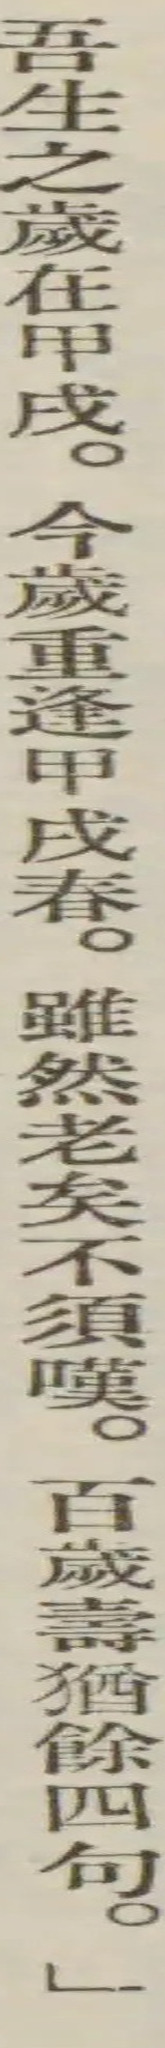吾生之歳在甲戌。今歳重逢甲戌春。雖然老矣不須嘆。百歳壽猶餘四句。」
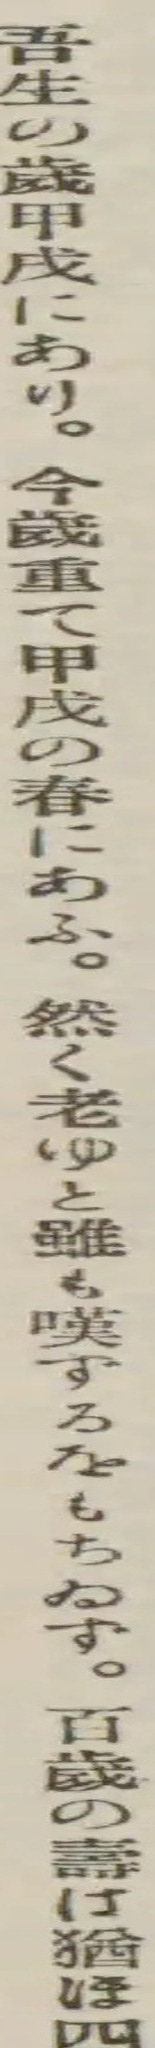吾生の歳甲戌にあり。今歳重て甲戌の春にあふ。然く老ゆと雖も嘆ずるをもちゐず。百歳の寿は猶ほ四旬を余す。
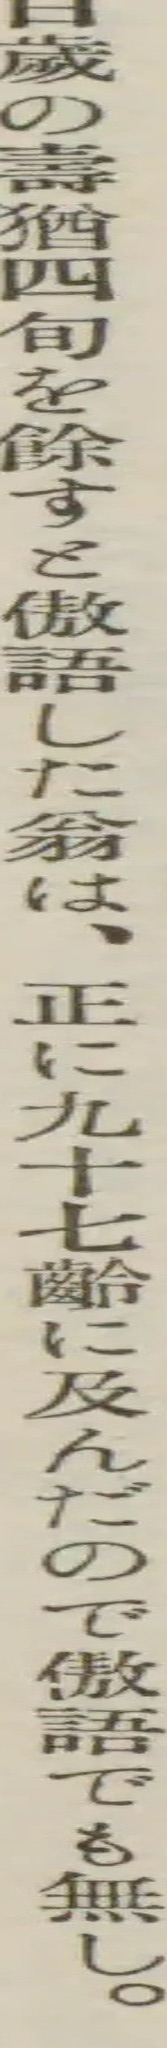百歳の寿猶四旬を余すと倣語した翁は、正に九十七齢に及んだので倣語でも無し。
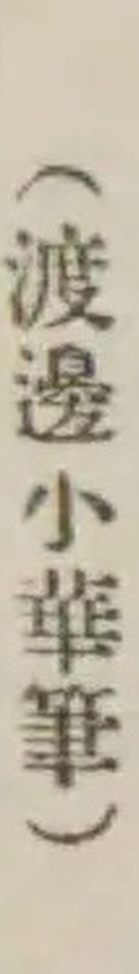(渡邊小華筆)
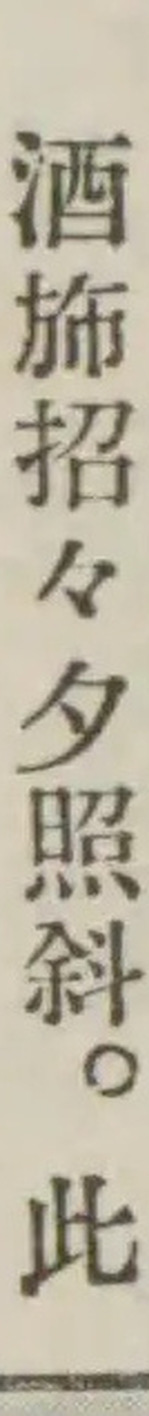酒旆招々夕照斜。此
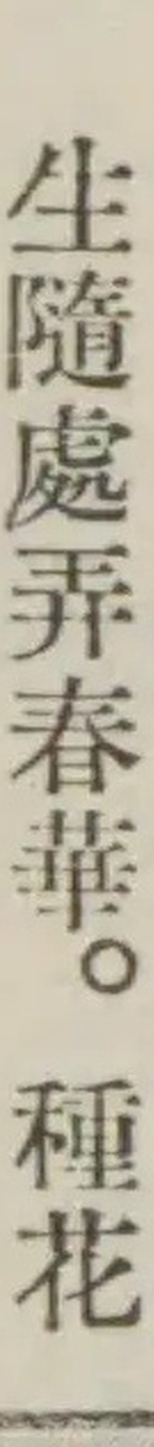生随處弄春華。種花
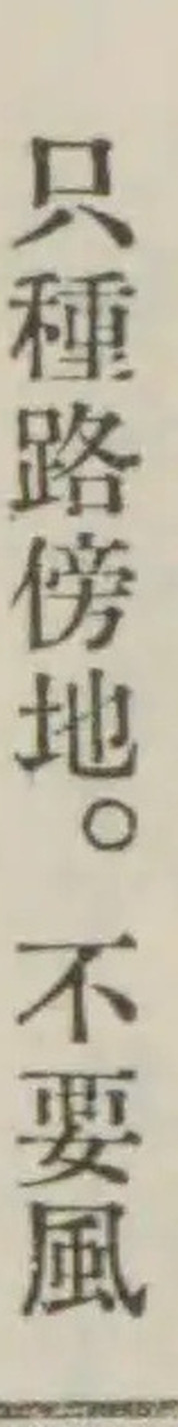只種路傍地。不要風
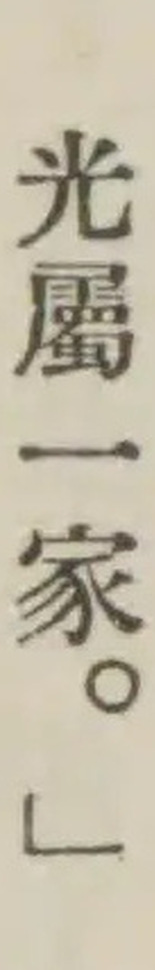光屬一家。」
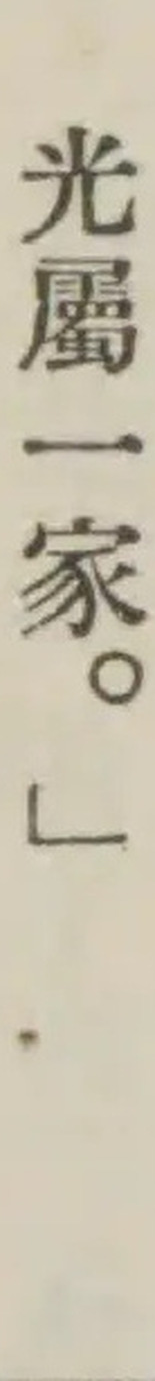光屬一家。」
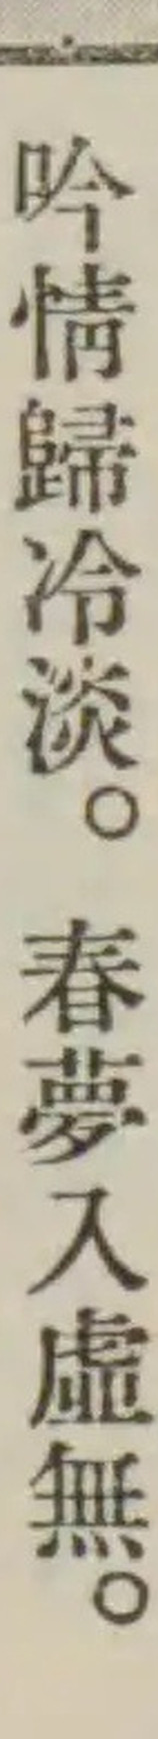吟情歸冷淡。春夢入虚無。
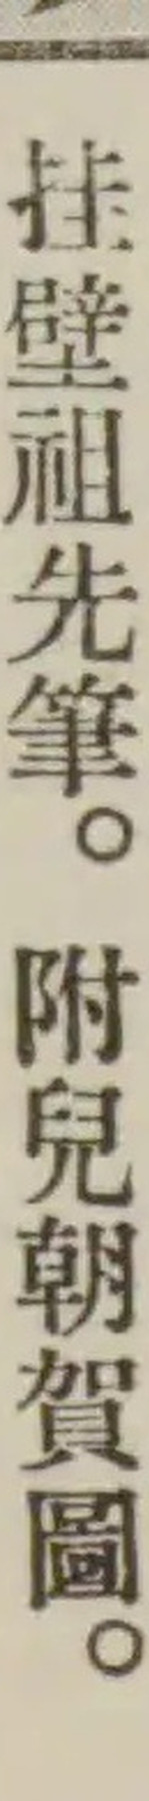挂壁祖先筆。附兒朝賀圖。
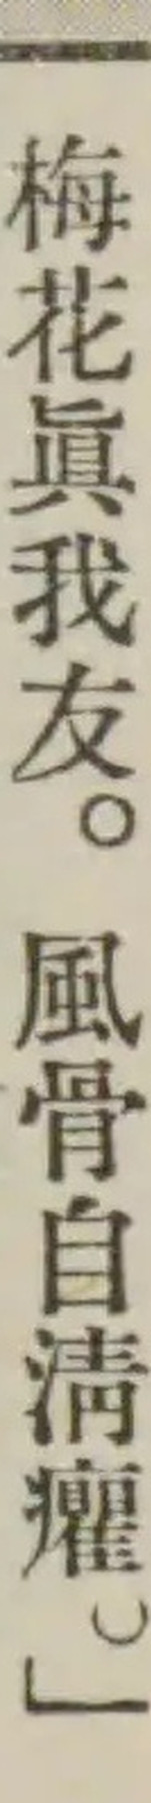梅花眞我友。風骨自清癯。」
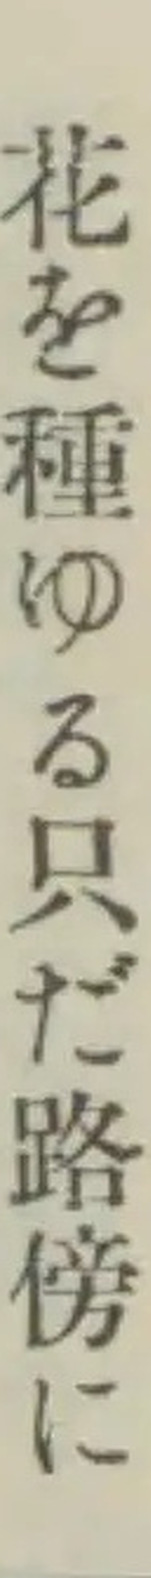花を種ゆる只だ路傍に
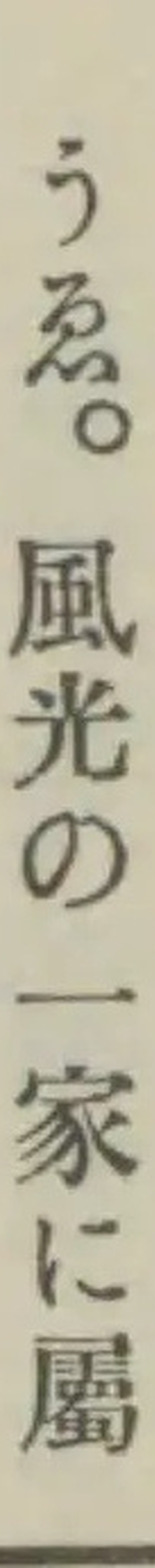うゑ。風光の一家に属
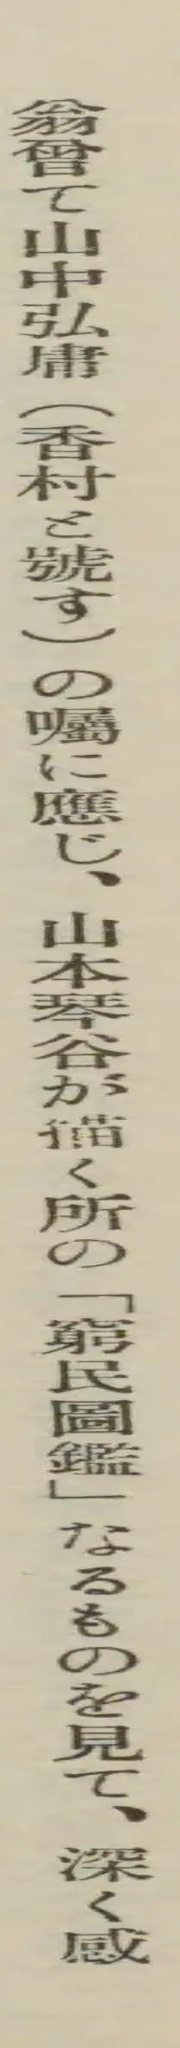翁曽て山中弘庸(香村と号す)の嘱に応じ、山本琴谷が描く所の「窮民図鑑」なるものを見て、深く感
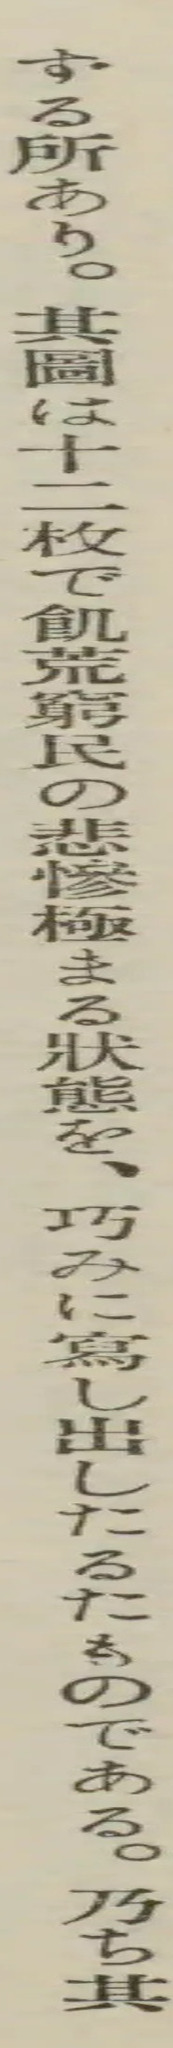ずる所あり。其図は十二枚で飢荒窮民の悲惨極まる状態を、巧みに写し出したるものである。乃ち其
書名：小野湖山翁小伝
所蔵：国立国会図書館 National Diet Library, JAPAN
